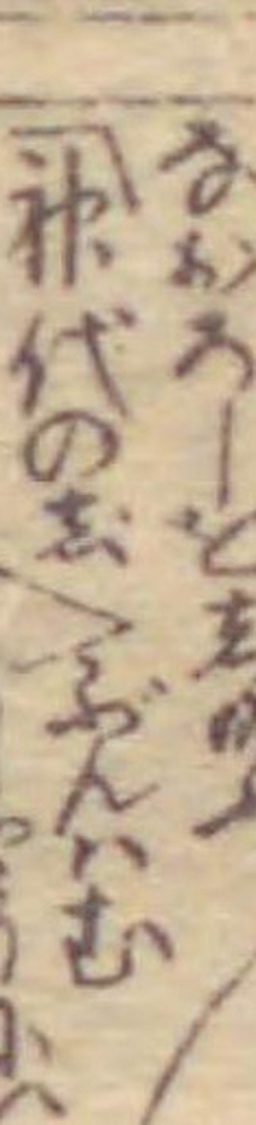〽神代のじぶんはむ
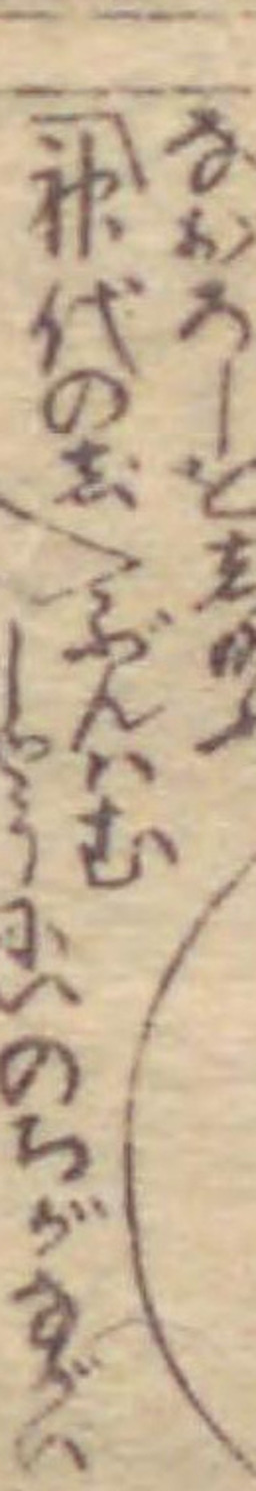〽神代のじぶんはむ
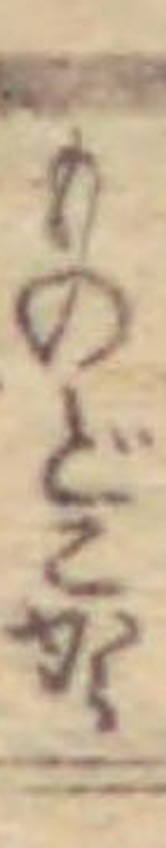ものどこから
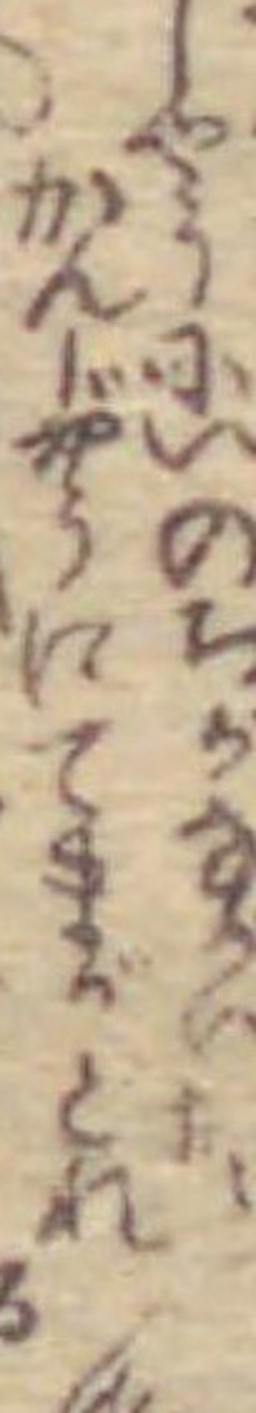かんじやうにてまがとれる
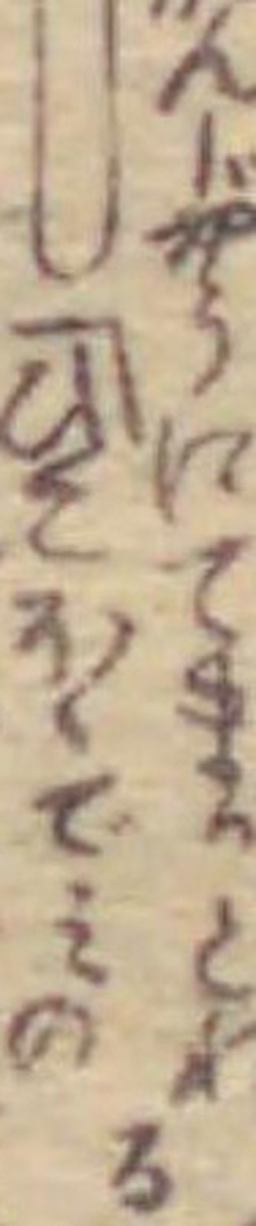〽ひこほゝでみの
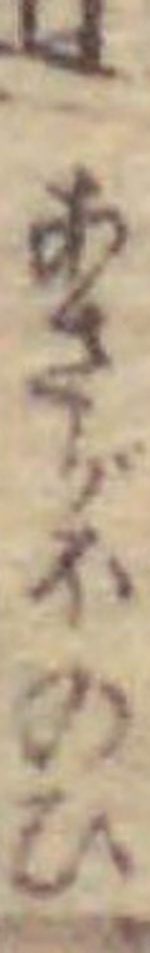あさがほのひ
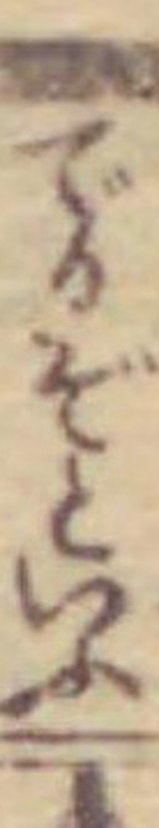でるぞといふ
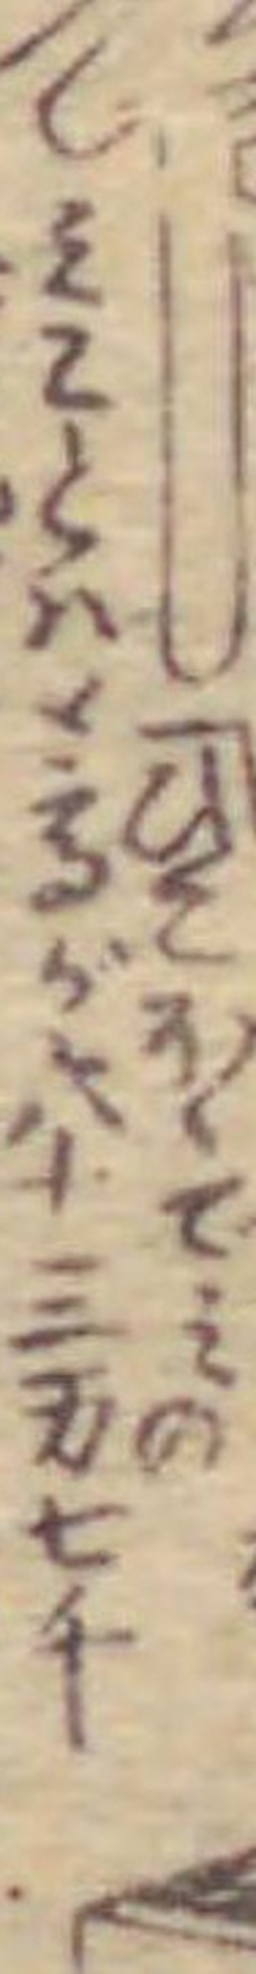みことはさるが六十三万七千
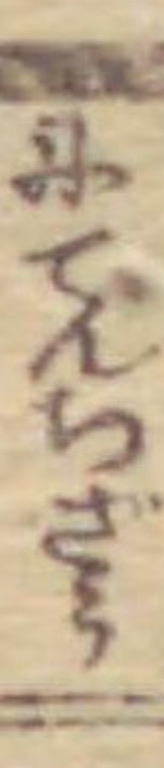にてんちざう
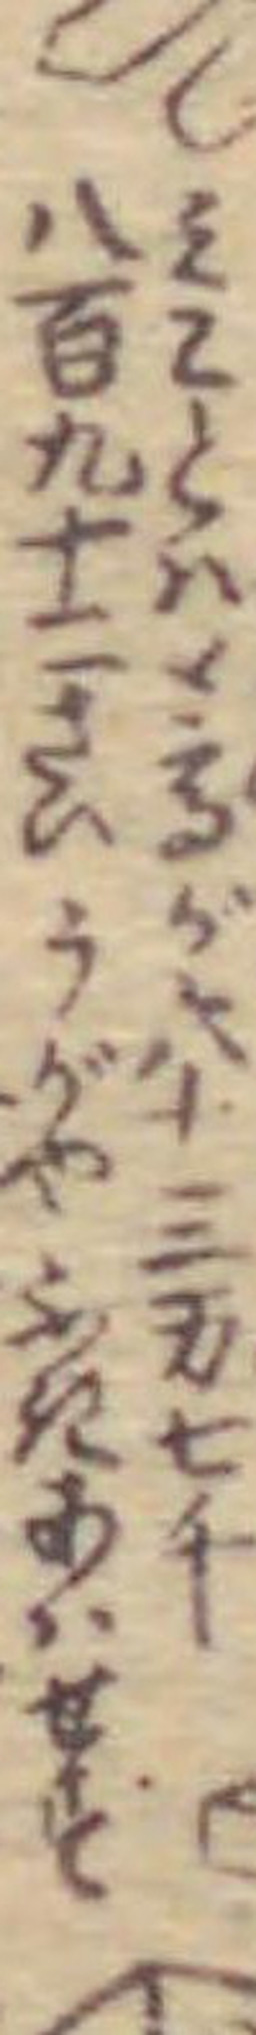八百九十二さいうがやふきあはせす
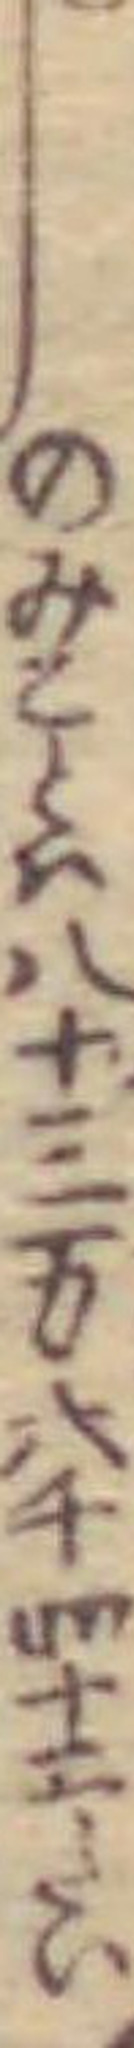のみことは八十三万六千四十二さい
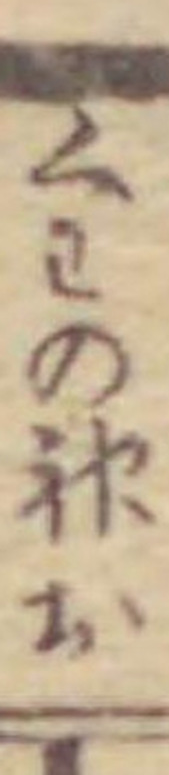くわの神お
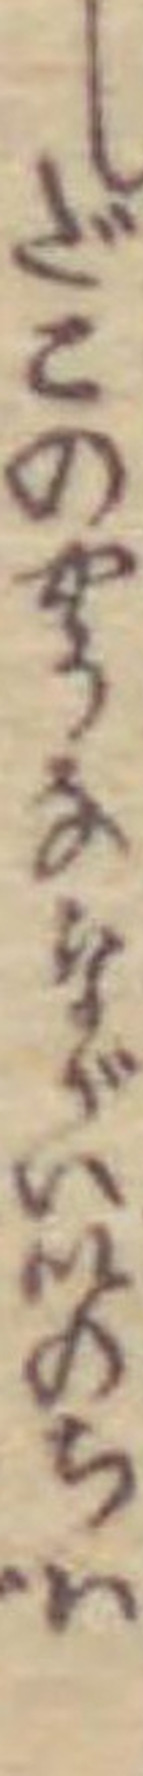だこのやうなながいいのちは
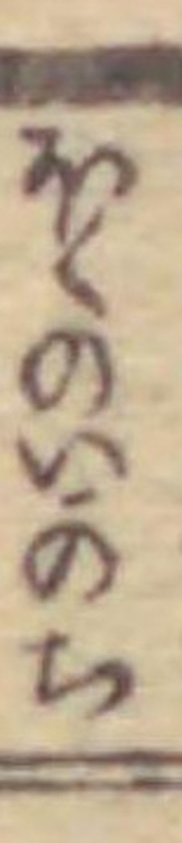ほくのいのち
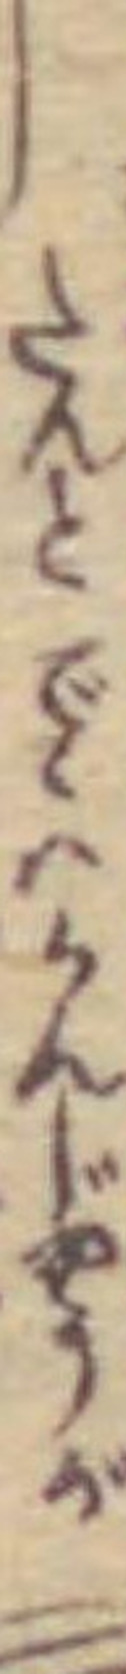たんとでゝはかんじやうが
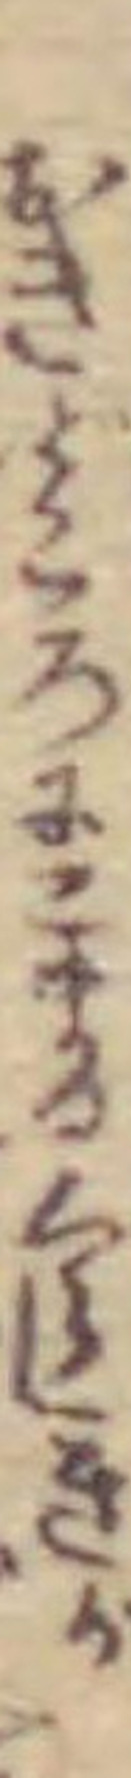おきどころにこまるくらしきが
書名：御誂染長寿小紋 : 3巻
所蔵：国立国会図書館 National Diet Library, JAPAN
